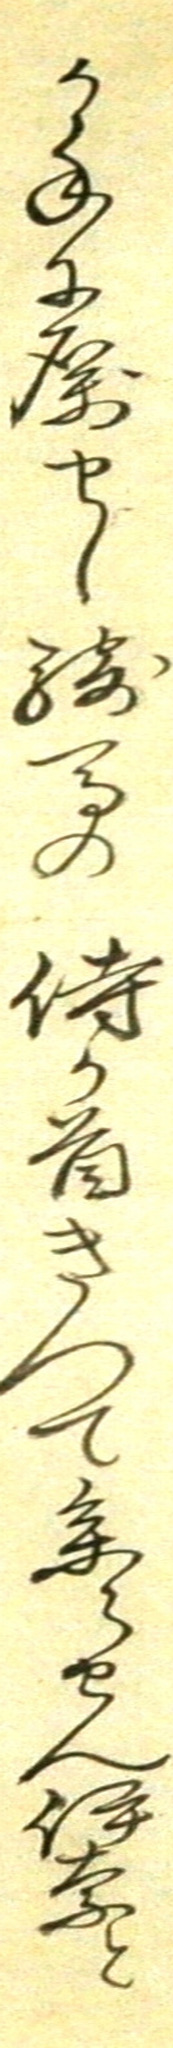か手に属せし騎馬の侍か首きつて参らせん伊奈と
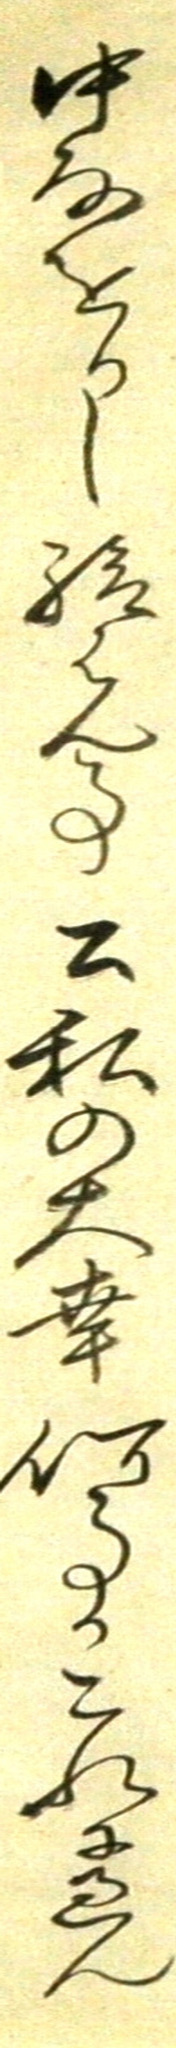中なをりし給はん事公私の大幸何事かこれに過ん
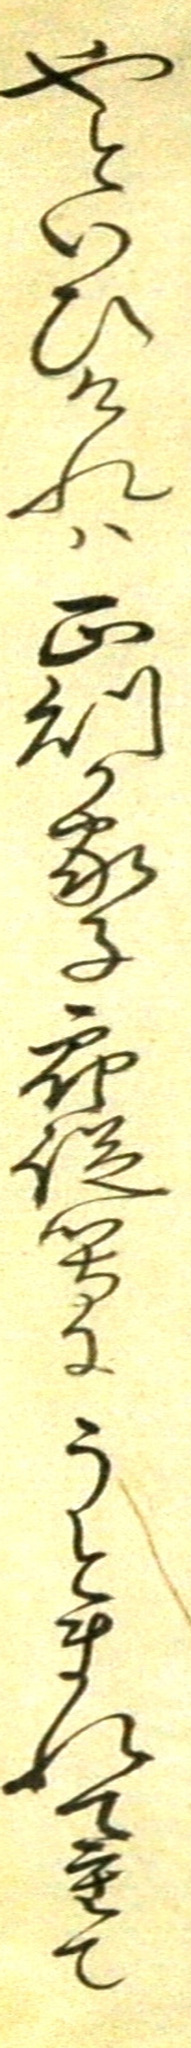やといひけれは正則か家子郎従等にうとまれて重て
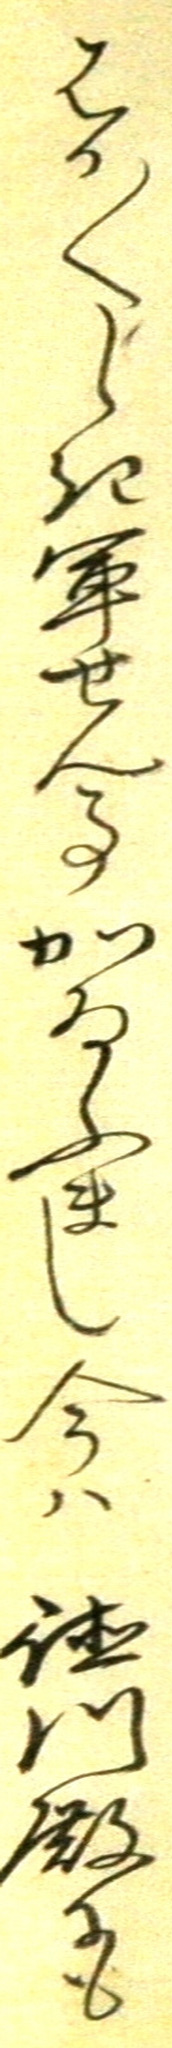はか〳〵しき軍せん事かなしふまし今は徳川殿にも

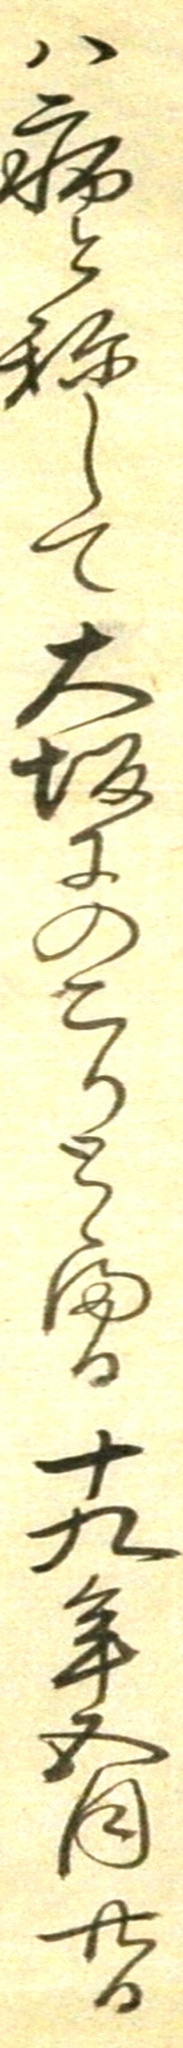は病と称して大坂にのこりとゝまる十九年五月廿日
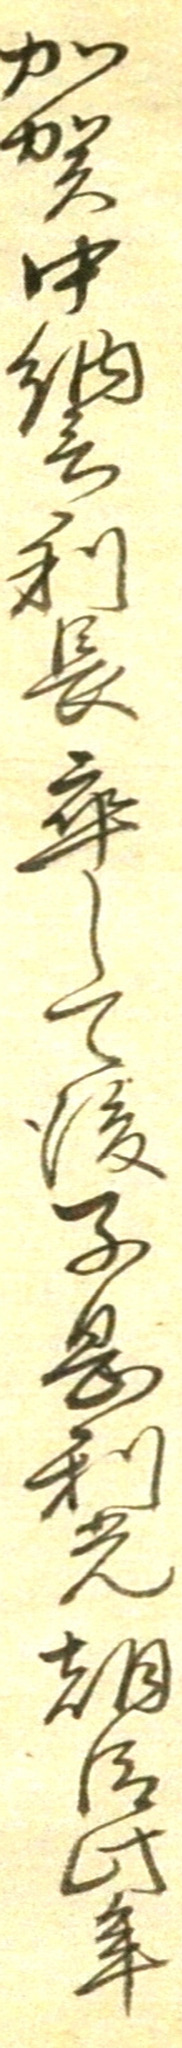加賀中納言利長卒して後子息利光朝臣此年
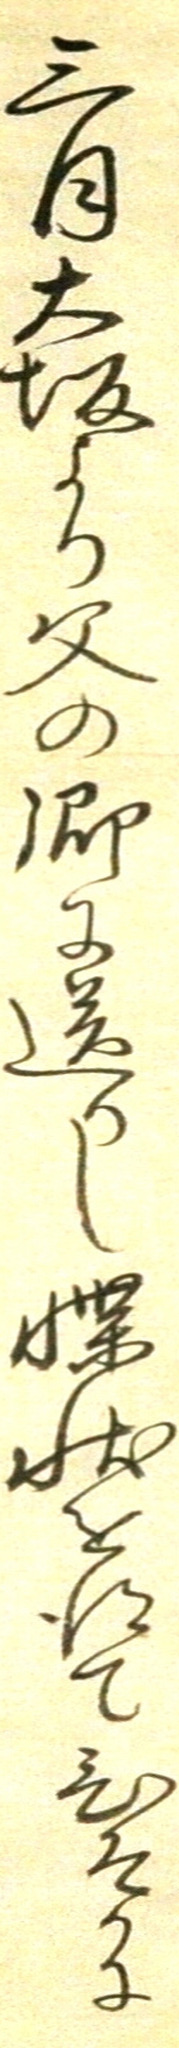三月大坂より父の卿に送りし牒状を得てひそかに
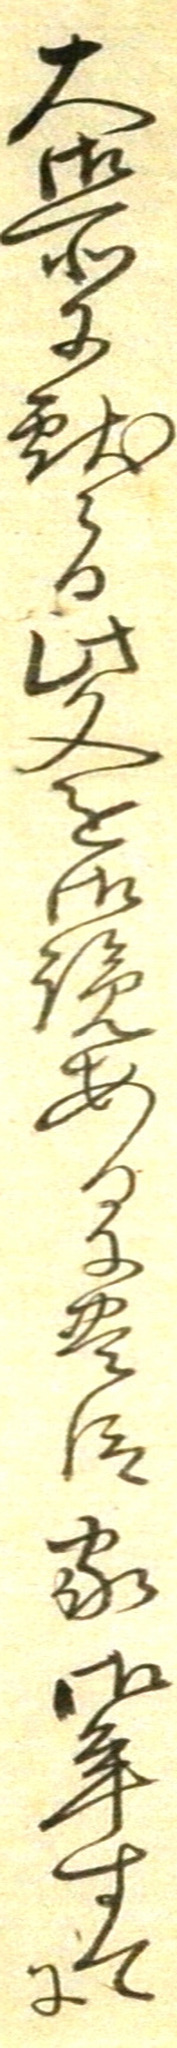大御所に献候間此文を御覧あるに豊臣家御年すてに
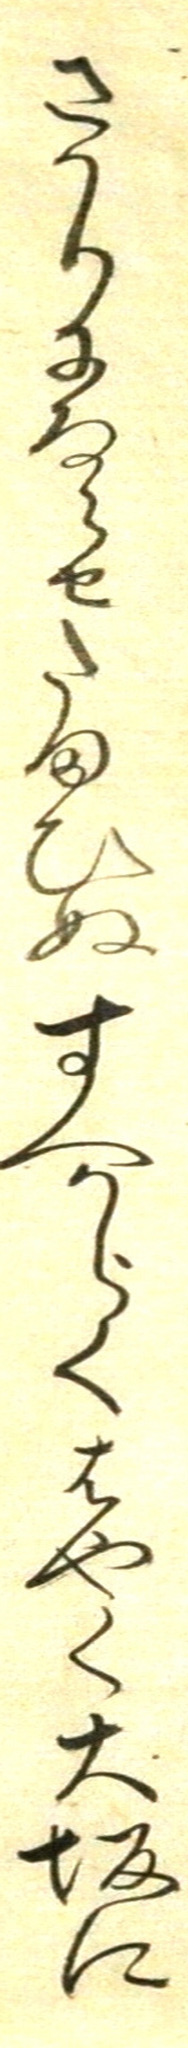さかりにならせたまひぬすへからくはやく大坂に
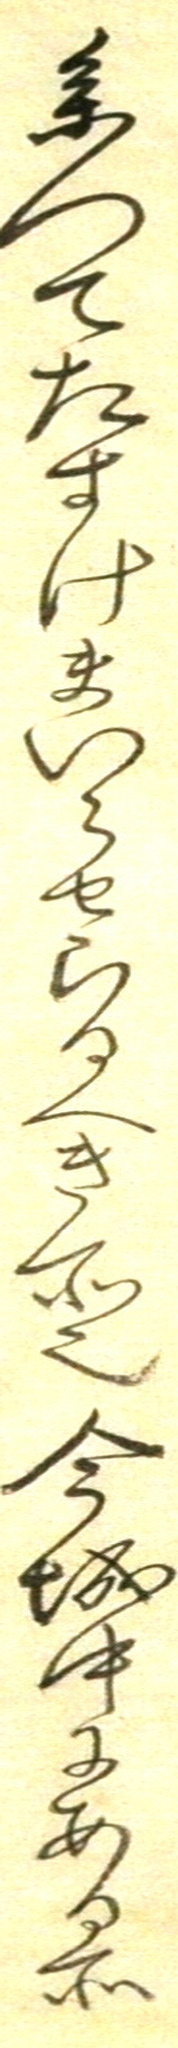参つてたすけまいらせらるへき所也今城中にある所
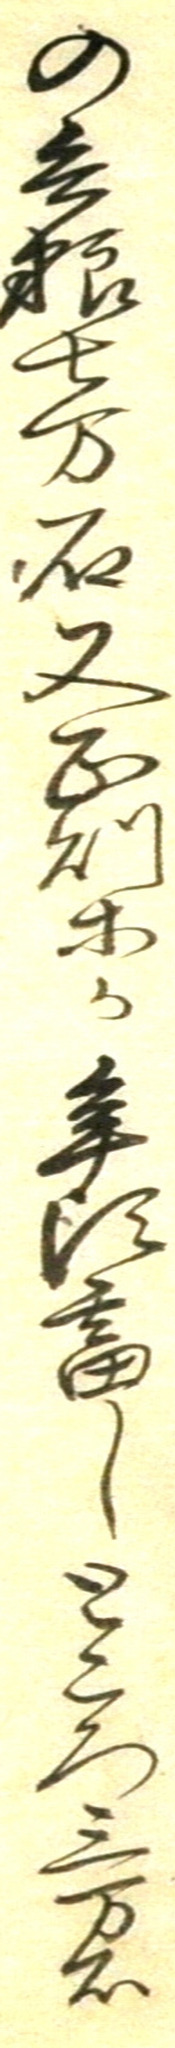の兵粮七万石又正則等か年頭蓄しところ三万石
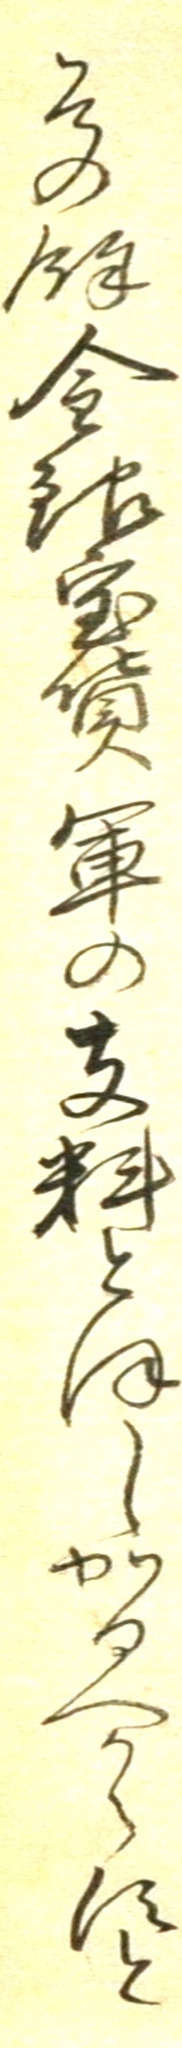その余金銀宝貨軍の支料とほしかるへからすと
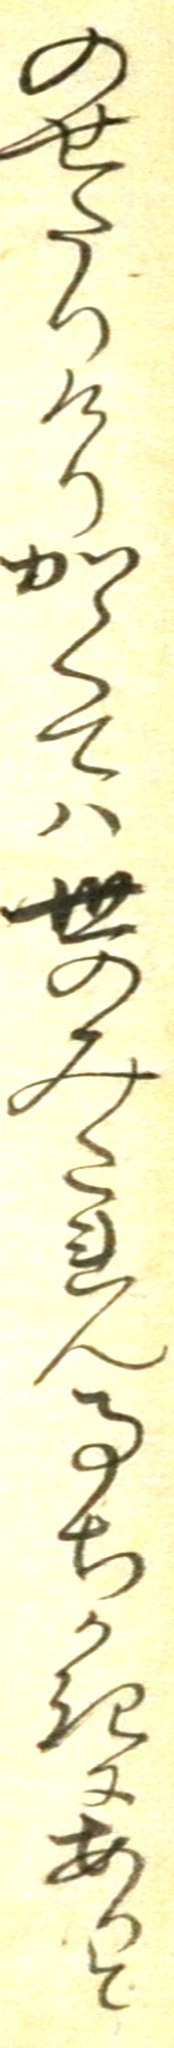のせたりけりかくては世のみたれん事ちかきにありと
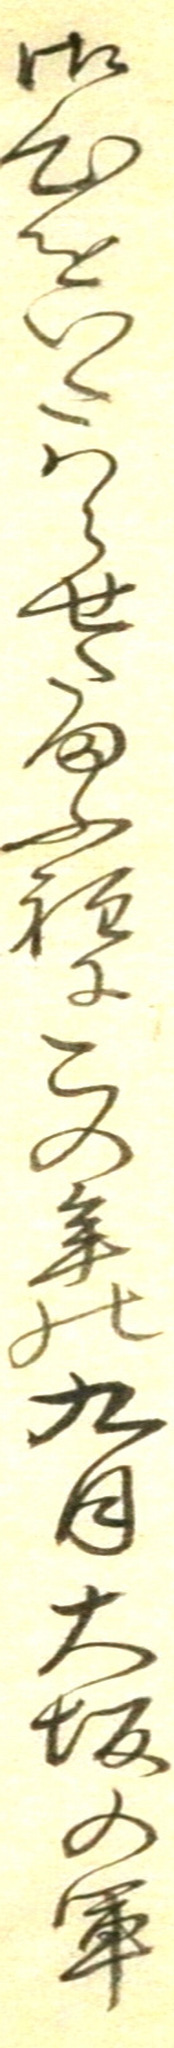御心をいたはらせたまふ程にこの年の九月大坂の軍
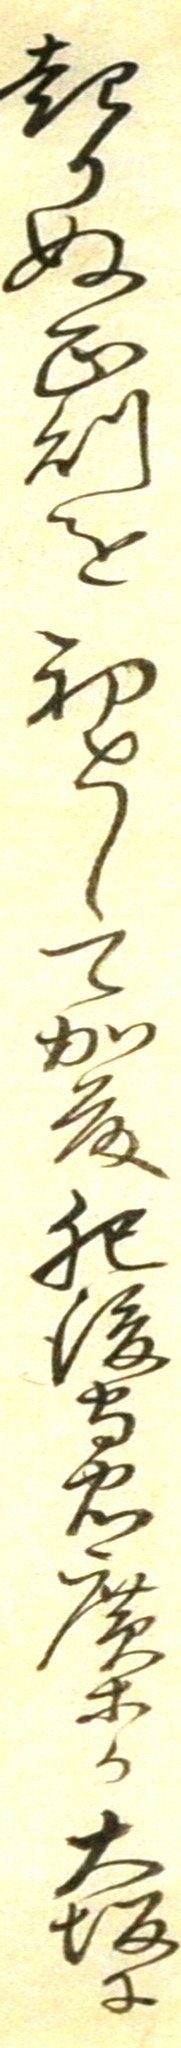起りぬ正則を初として加藤肥後守忠広等か大坂に
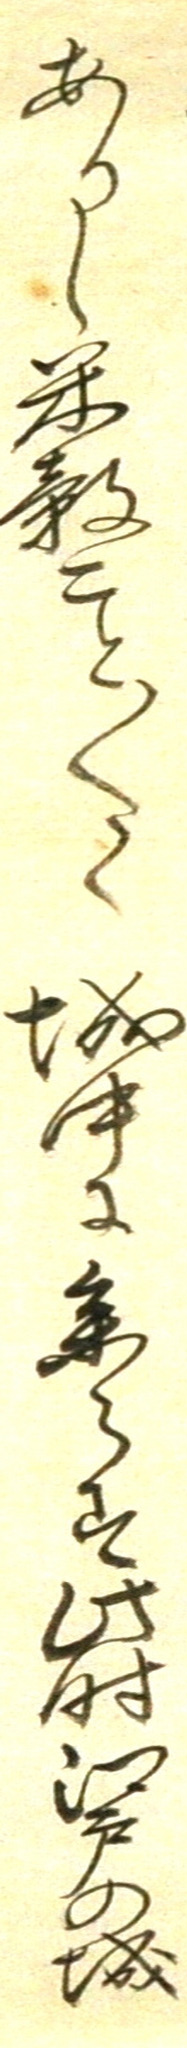ありし米穀こと〳〵く城中に参らす此時江戸の城
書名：藩翰譜（十二・上）
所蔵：伊那市立高遠町図書館・合同会社AMANE
